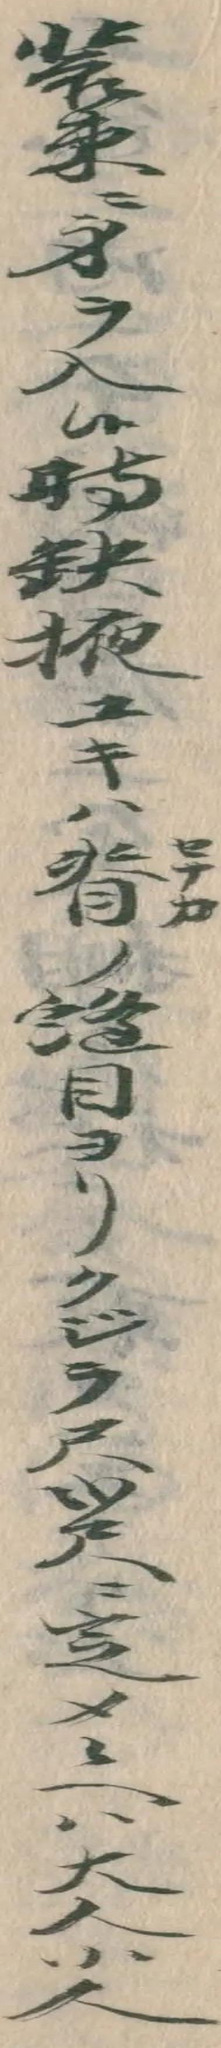装束ニ身ヲ入候時缺掖ユキハ背ノ縫目ヨリクジラ尺弐尺ニ定メ候へハ大人小人
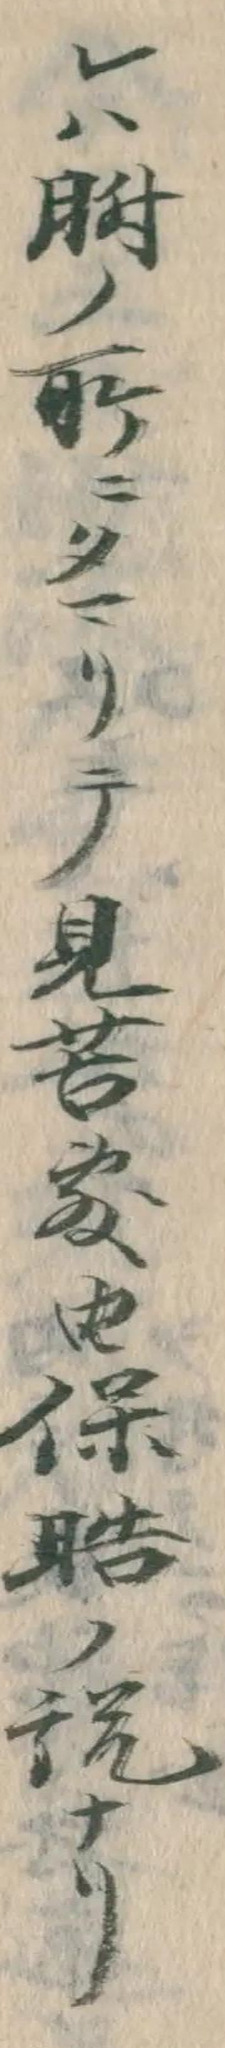レハ胕ノ所ニタマリテ見苦敷由保晧ノ説ナリ
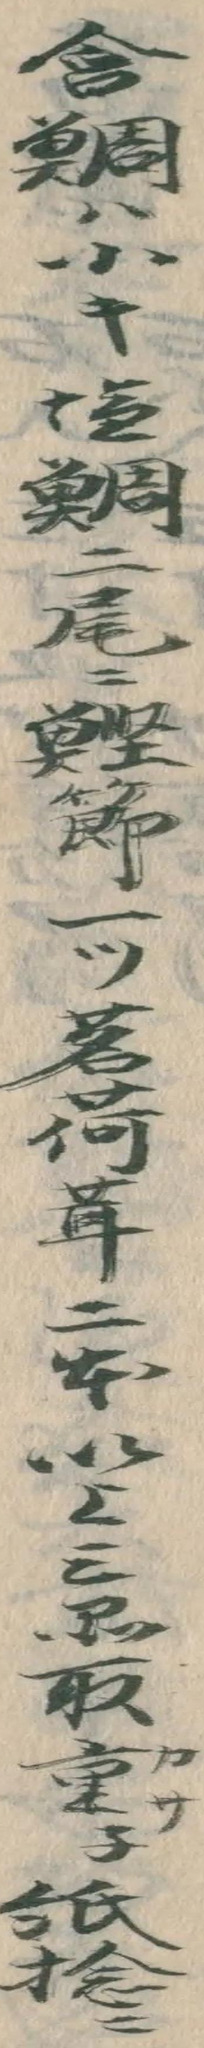含鯛ハ小キ塩鯛二尾ニ鰹節一ツ茗荷茸二本以上三品取重ネ紙捻ニ

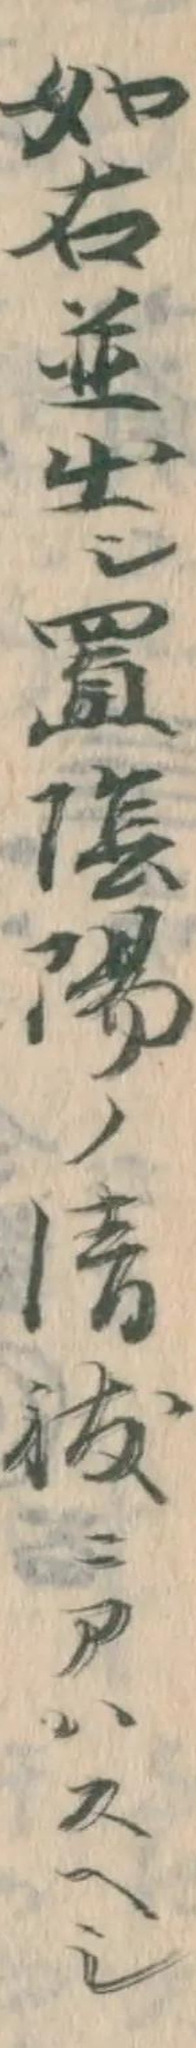如右並出シ置陰陽ノ清祓ニアハスヘシ
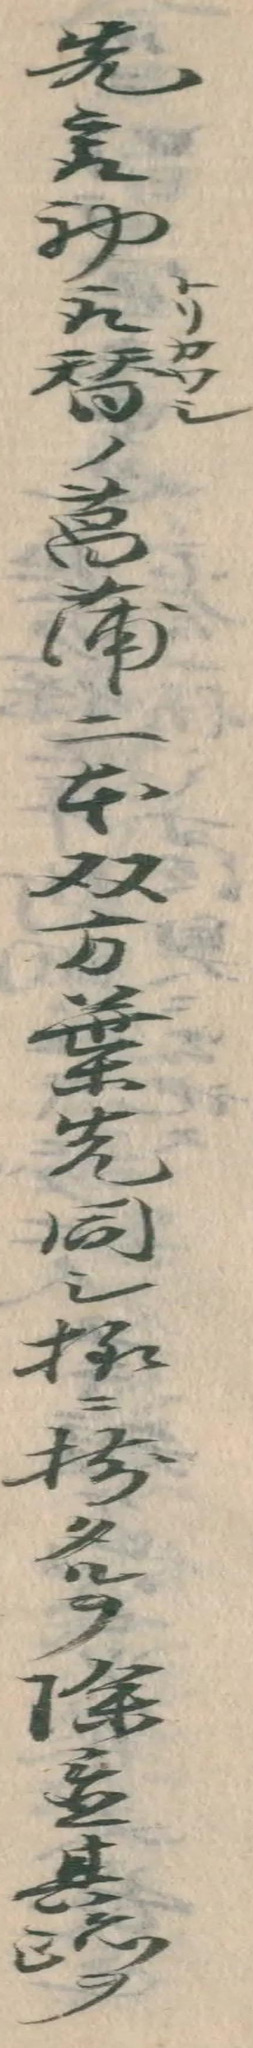先取初取替ノ菖蒲二本双方葉先同シ様ニ揃タルヲ除置其跡ヲ
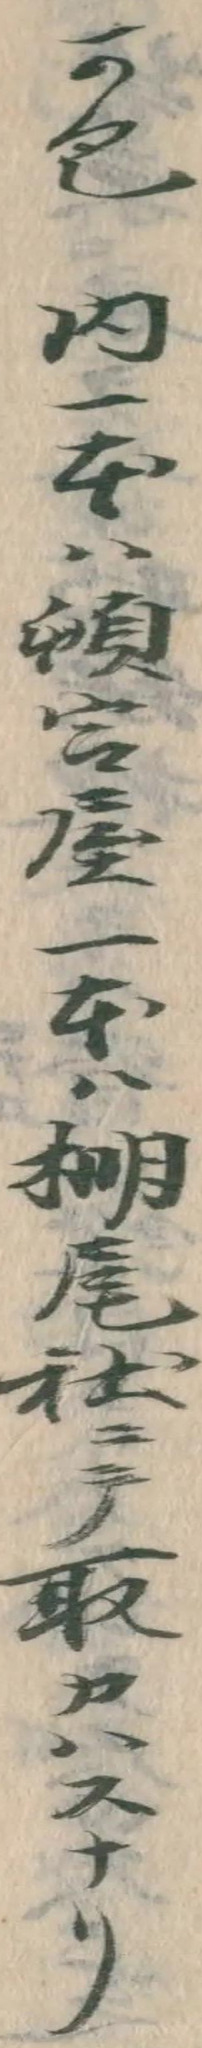可包内一本ハ頓宮屋一本ハ棚尾社ニテ取カハスナリ
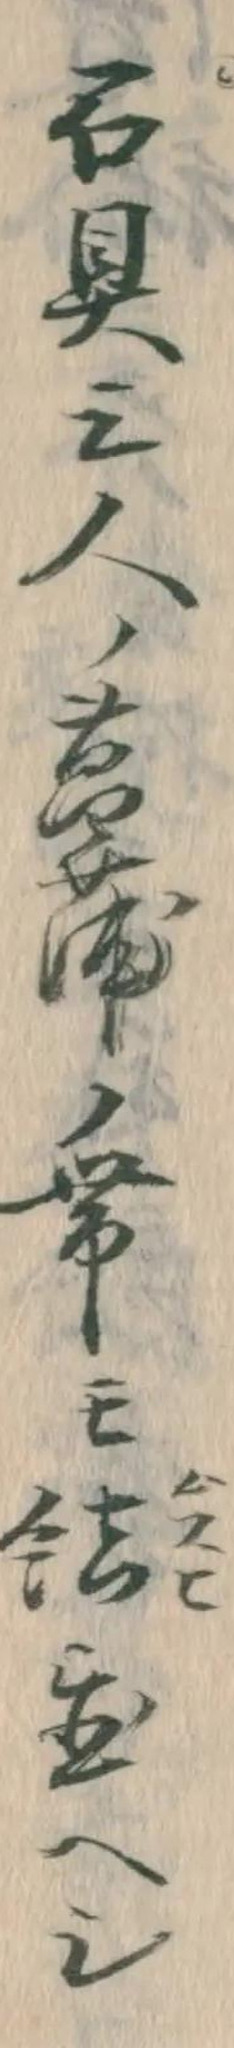石具三人ノ菖蒲ノ帯モ結置ヘシ
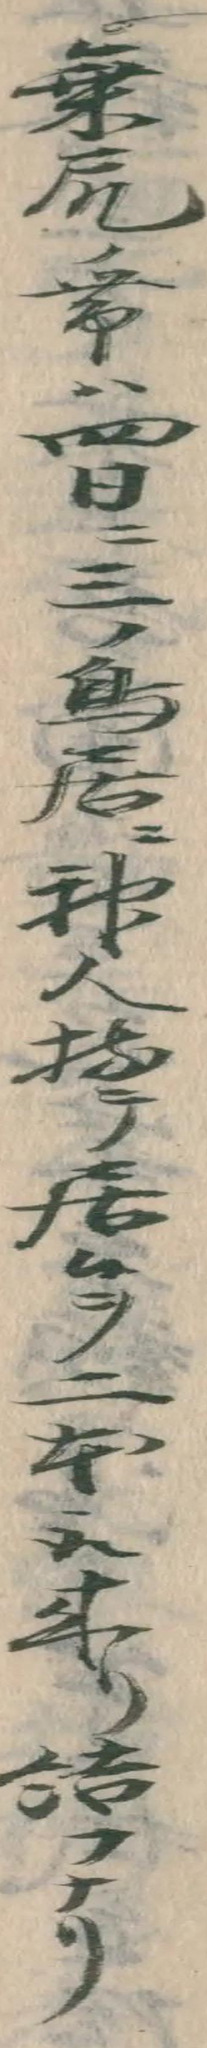乗尻ノ帯ハ四日ニ三ノ鳥居ニ神人持テ居候ヲ二本取来リ結フナリ
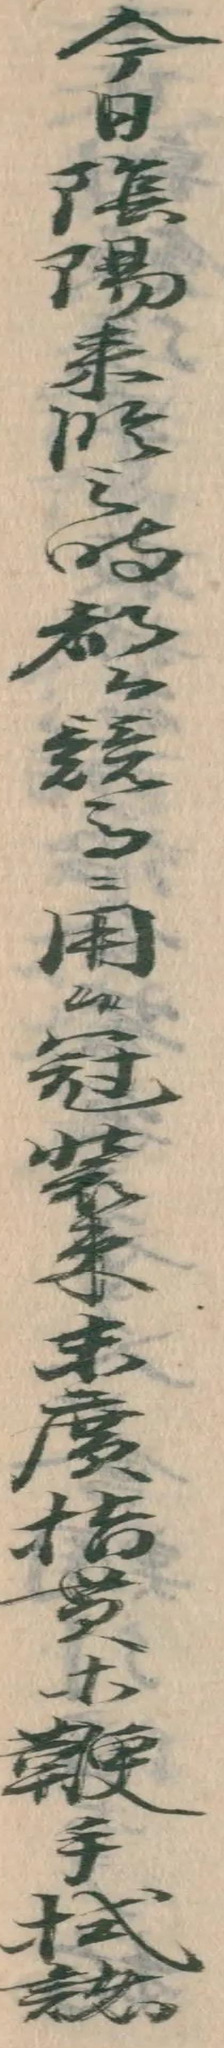今日陰陽来臨之時都而競馬ニ用候冠装束末広指貫等鞭手拭諸
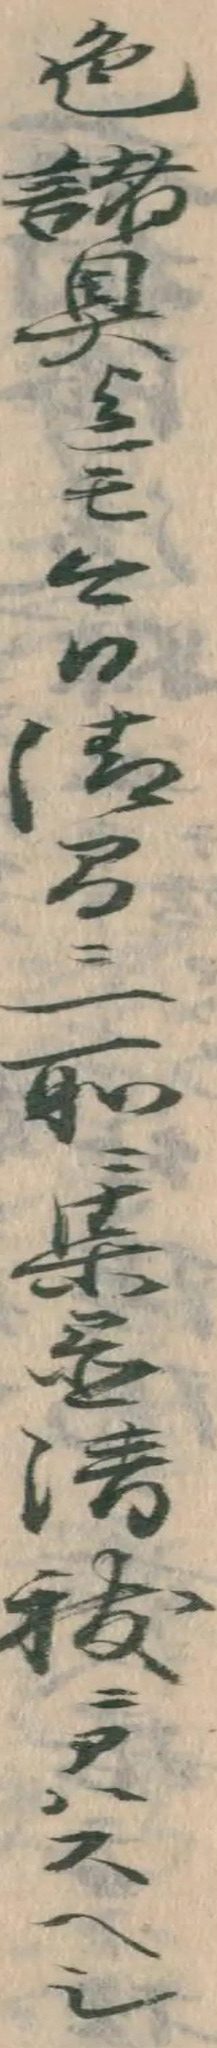色諸具迄モ今日清間ニ一所ニ集置清祓ニアハスヘシ
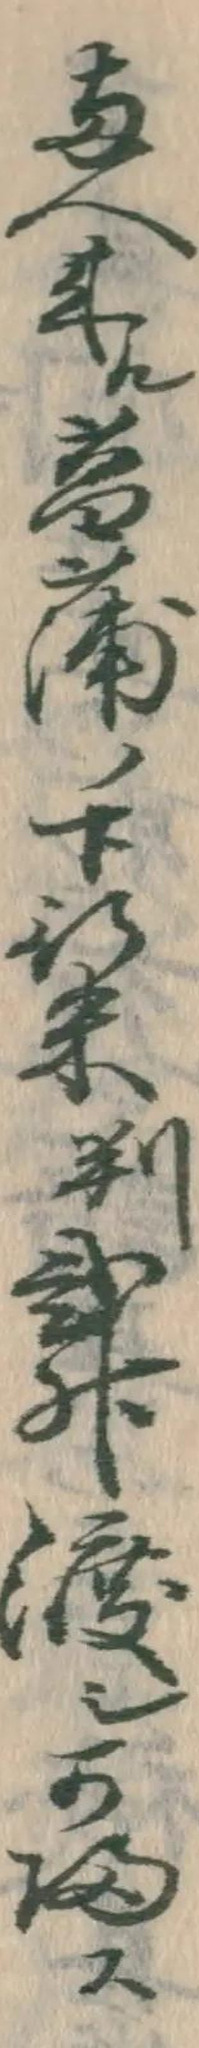両人来ル菖蒲ノ下行米判弐升渡シ可帰ス
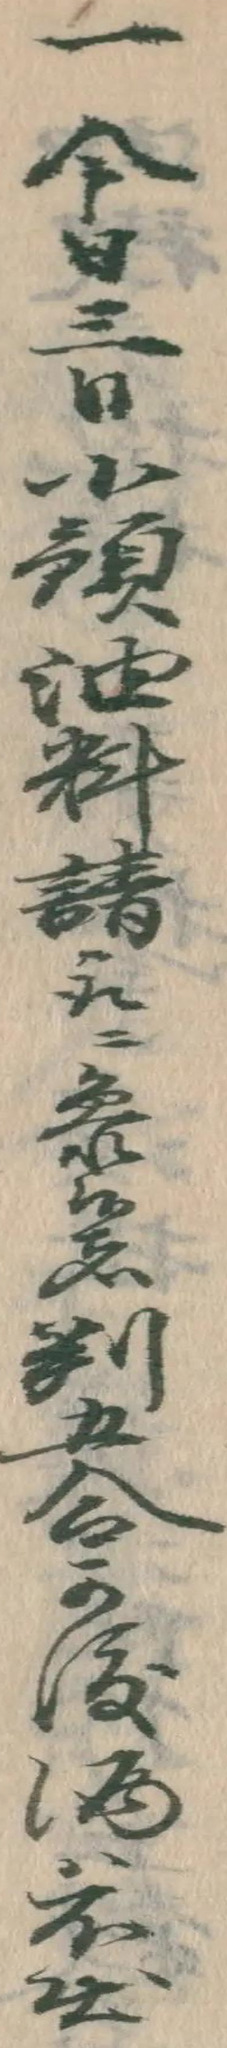一今日三日小預油料請取ニ参候者判五合可渡酒ハ不出
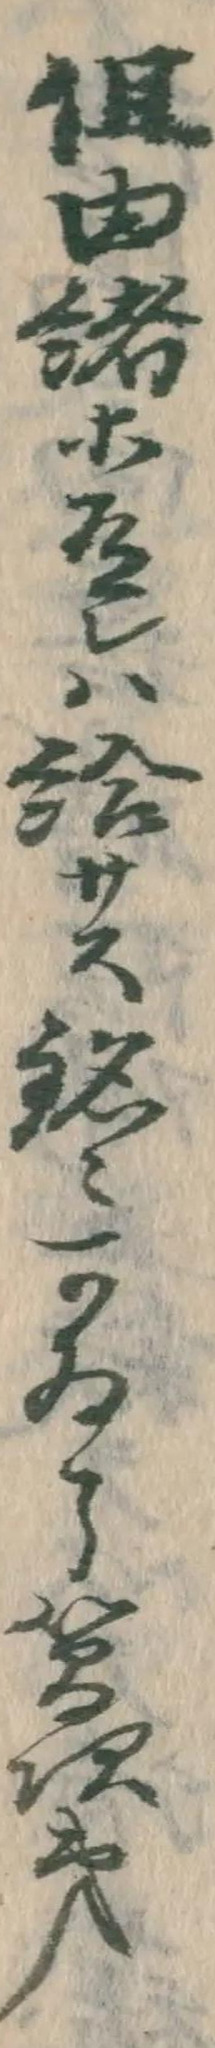但由緒等有レハ給サス銘々可為了簡次第
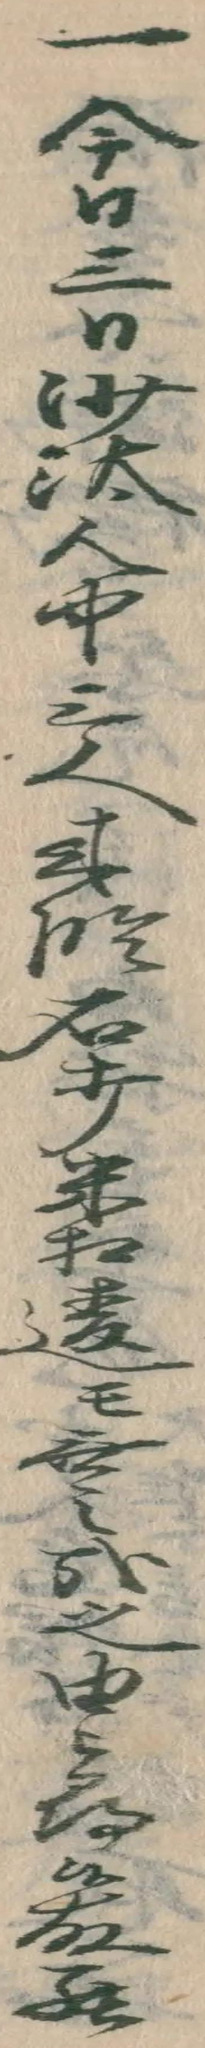一今日三日沙汰人中三人来臨石打米相違モ無之哉之由被尋候故罷
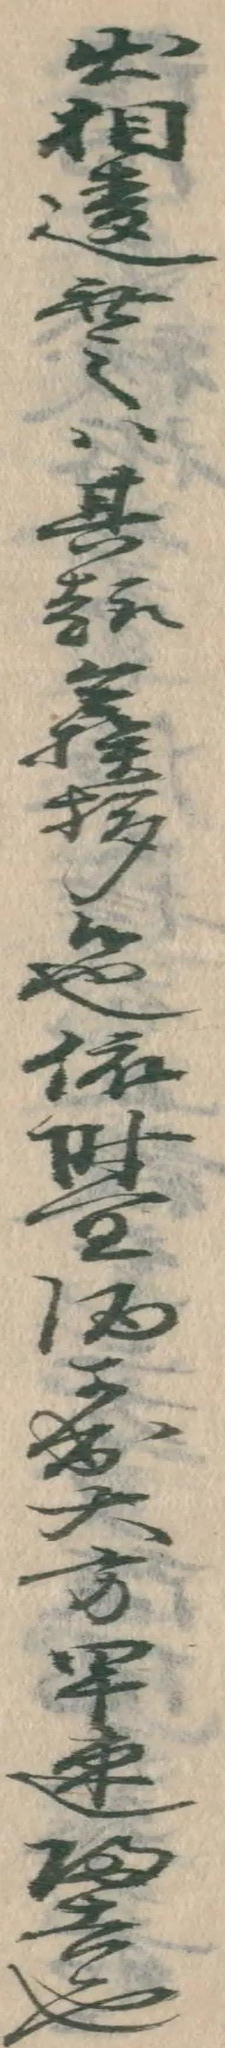出相違無之ハ其趣令挨拶候也依時宜酒可出大方早速帰去也
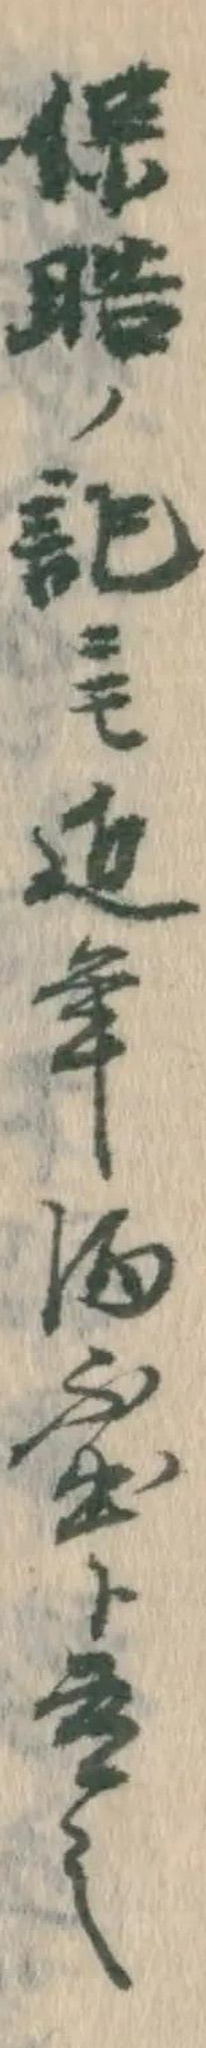保晧ノ記ニモ近年酒不出ト有之
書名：賀茂社記録. 第11冊
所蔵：国立国会図書館 National Diet Library, JAPAN
